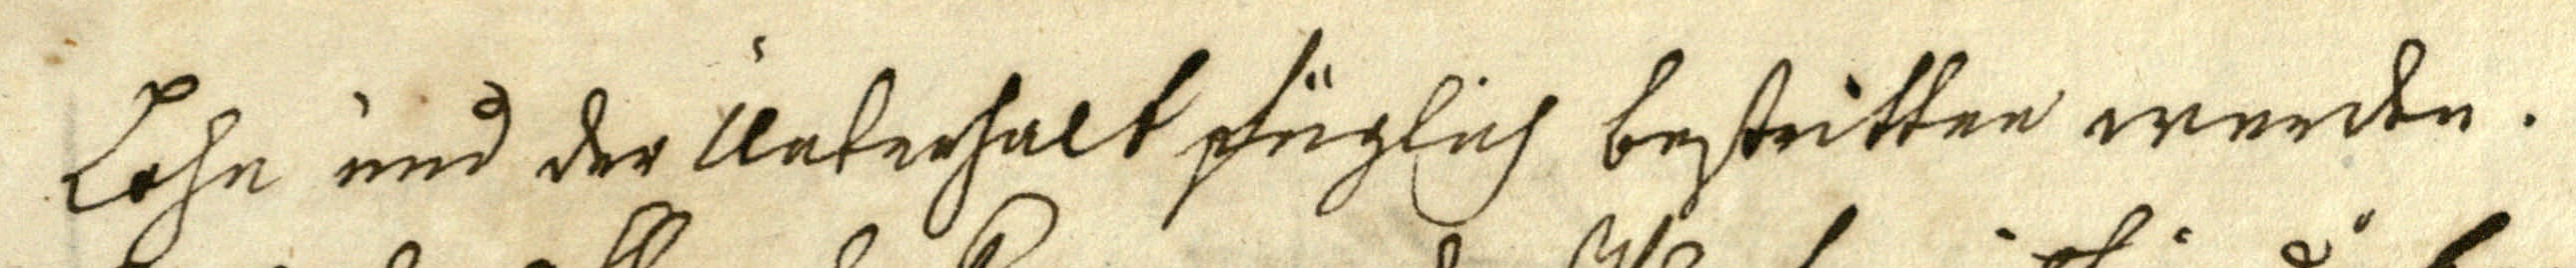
Lohn und der Unterhalt füglich bestritten werden.
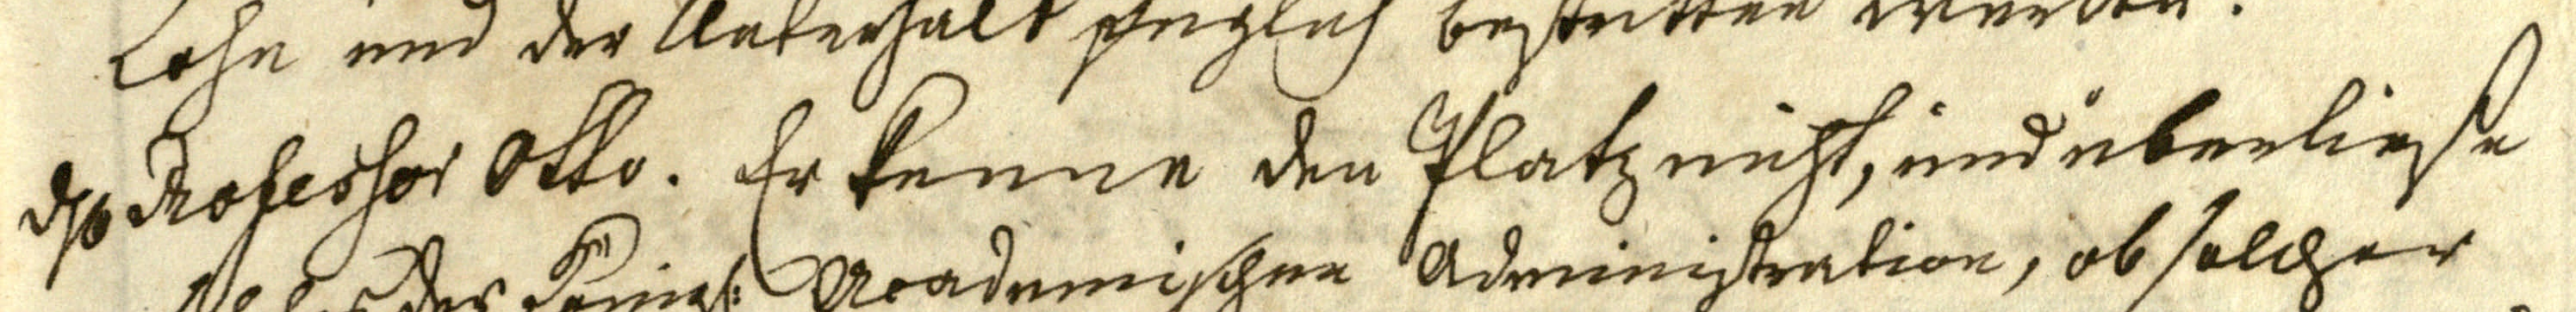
dh Professor Otto. Er. kenne den Platz nicht, und überließe
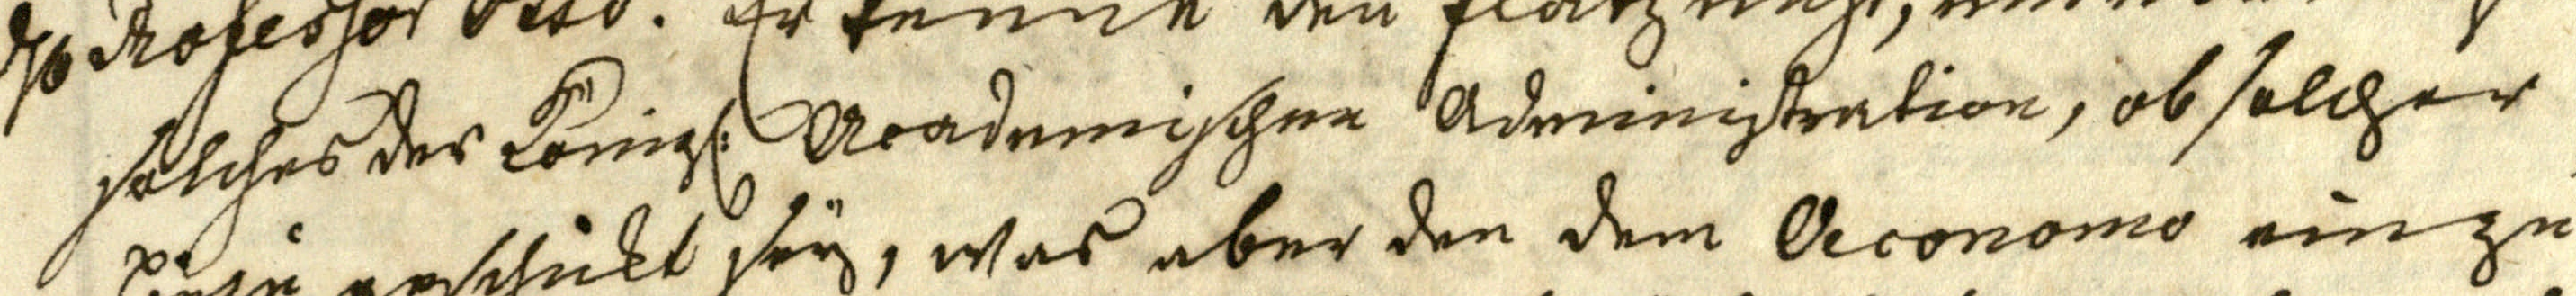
solches der Königl. Academischen Administration, ob solcher
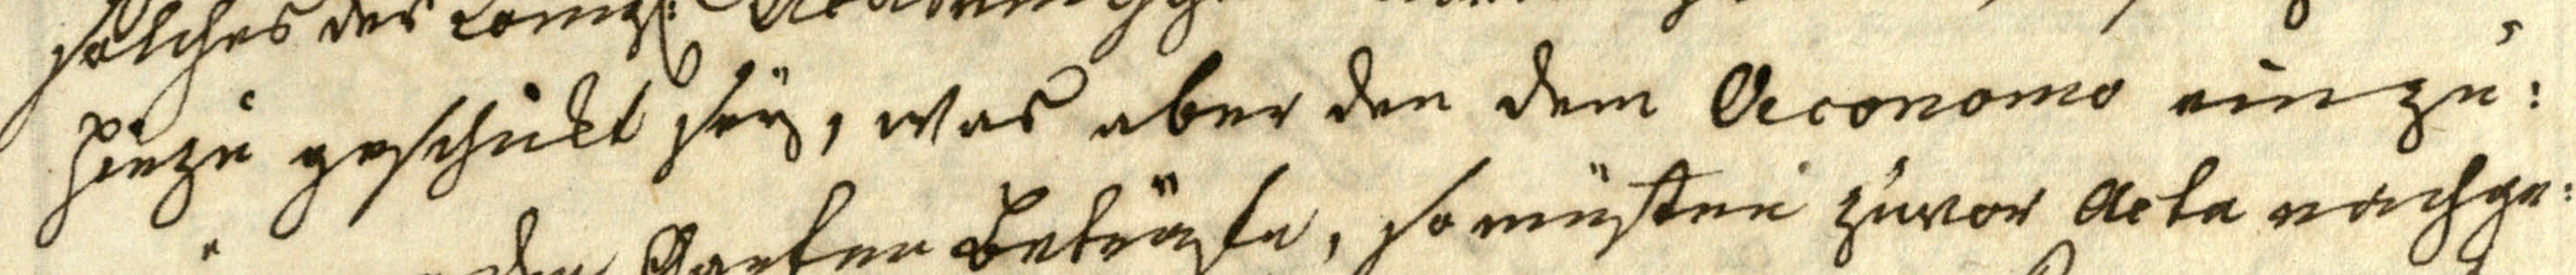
hiezu geschickt seÿ, was aber den dem Oeconomo einzu¬
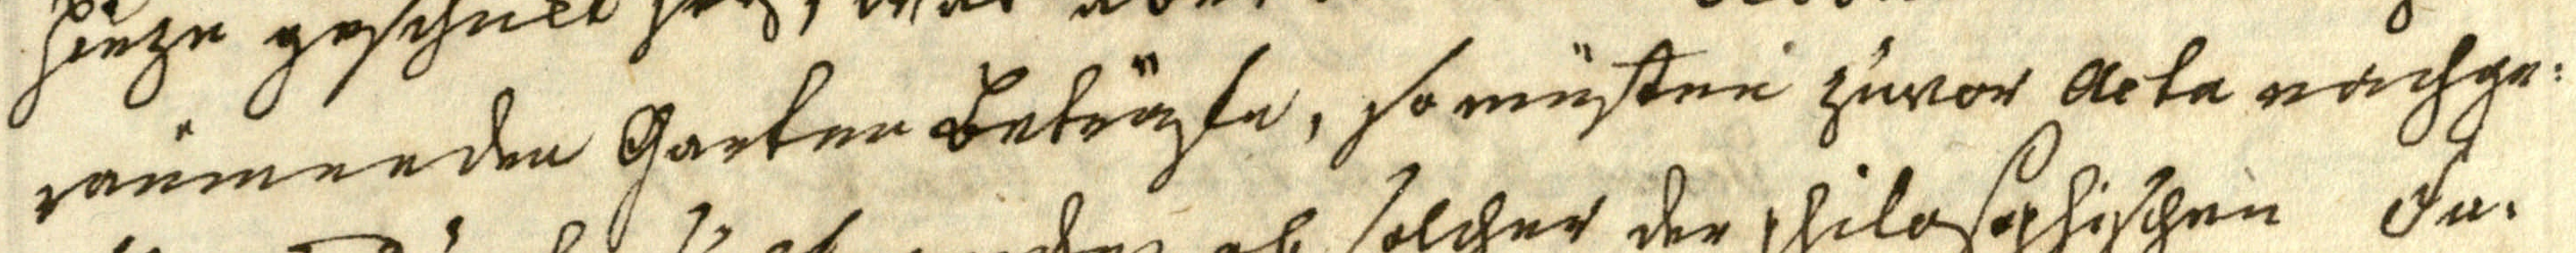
räumenden Garten beträfe, so müsten zuvor Acta nachge¬
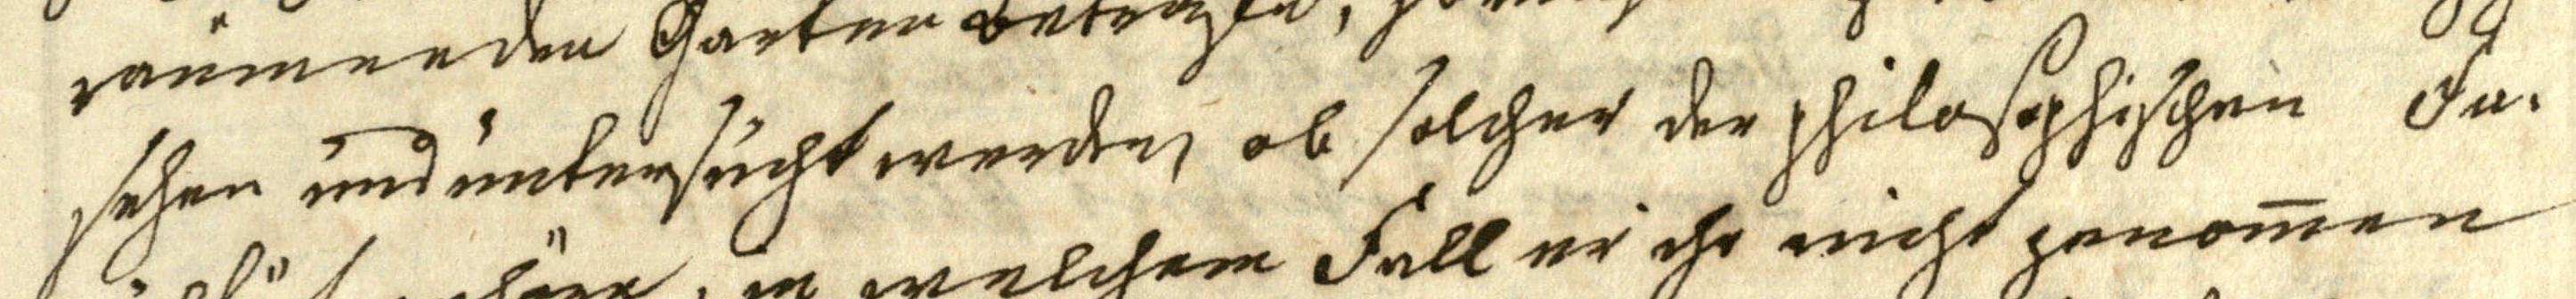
sehen und untersucht werden, ob solcher der philosophischen Fa¬
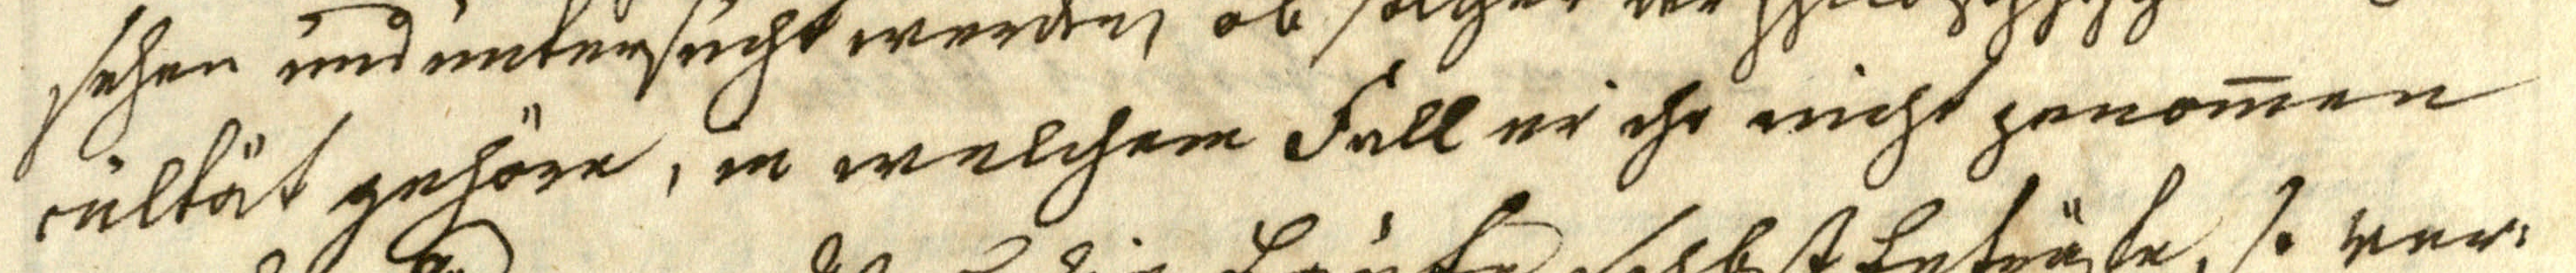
cultät gehöre, in welchem Fall er ihr nicht genomen
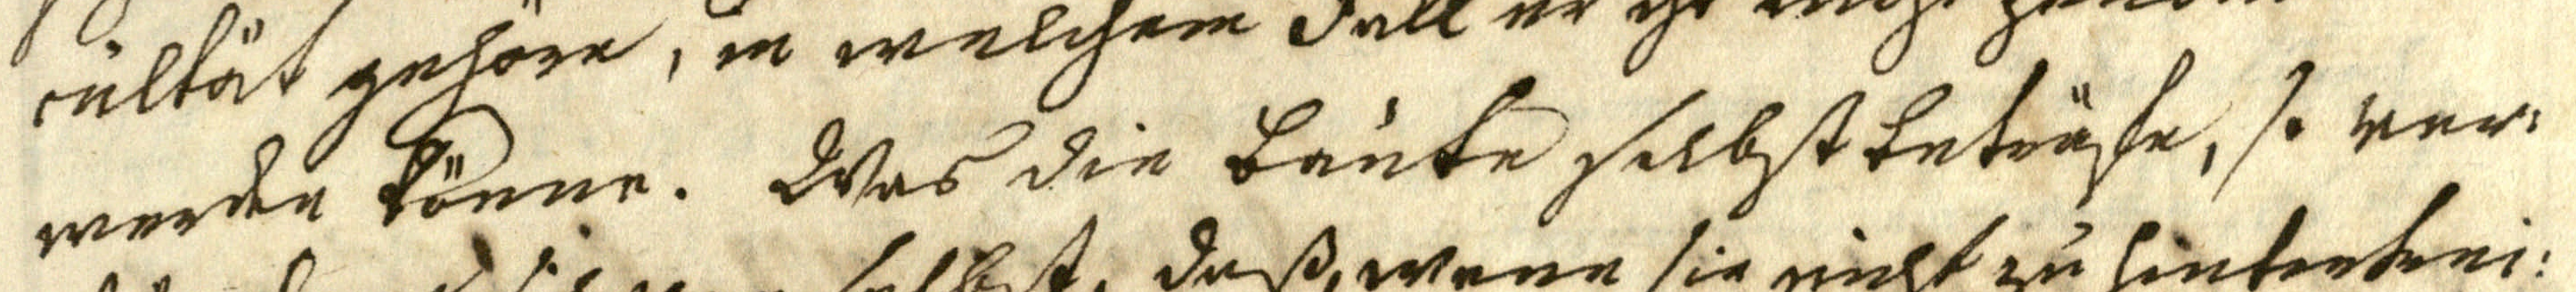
werden könne. Was die Baute selbst beträfe, so ver¬
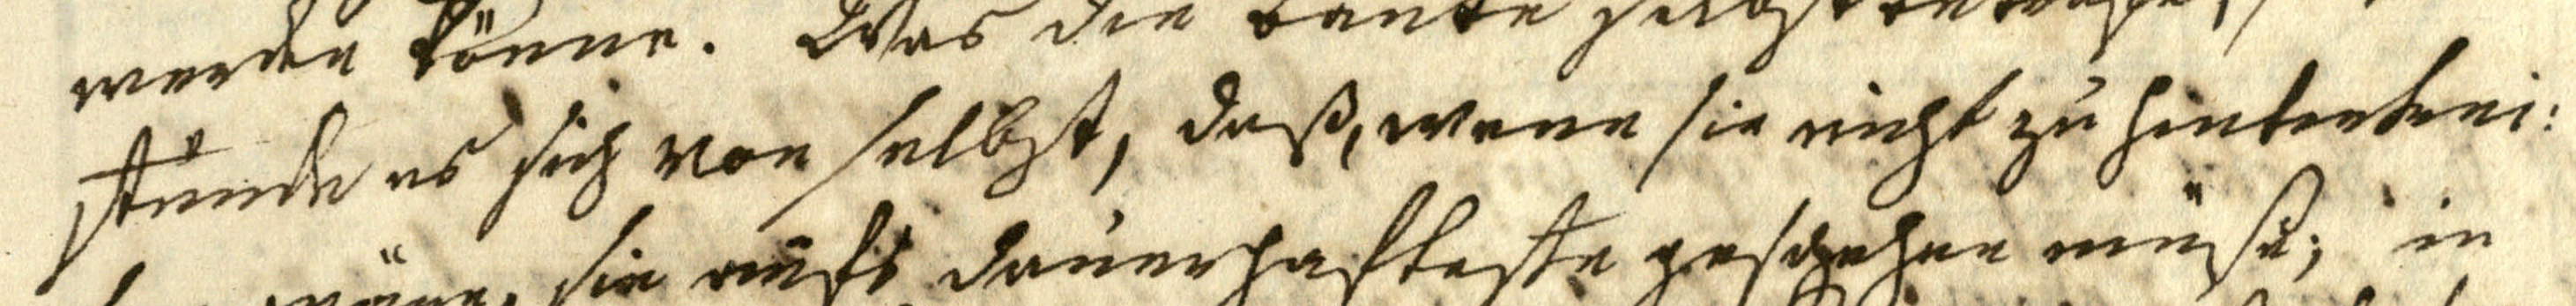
stünde es sich von selbst, daß, wenn sie nicht zu hietertrie¬
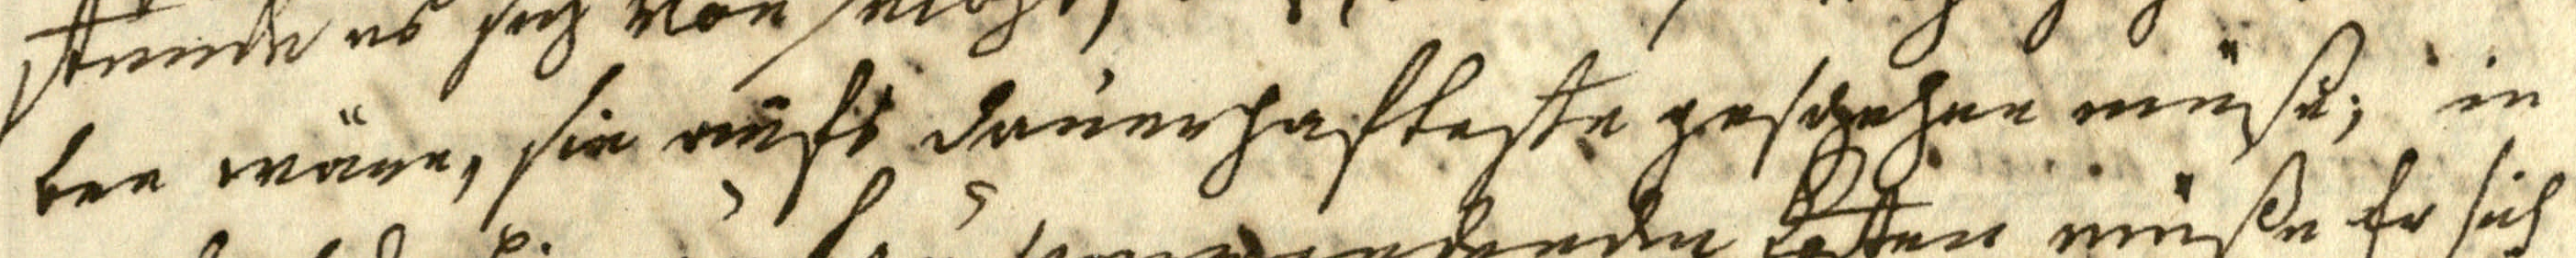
ben wäre, sie aufs dauerhafteste geschehen müße, in
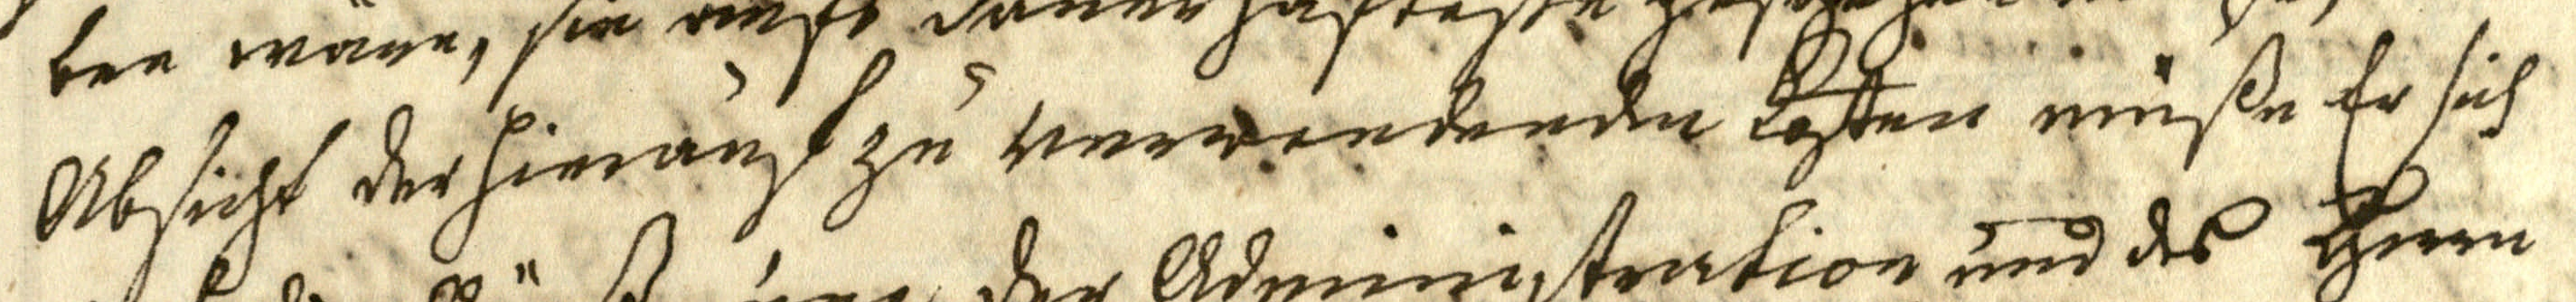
Absicht der hierauf zu verwendenden Kosten müße Er sich
